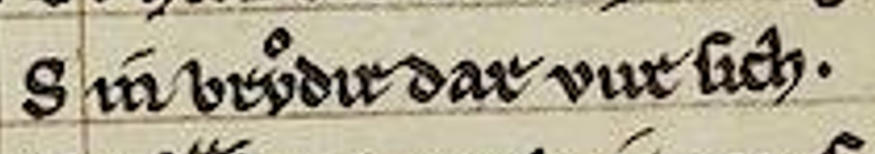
Sin brv°odir dar vur ſich.
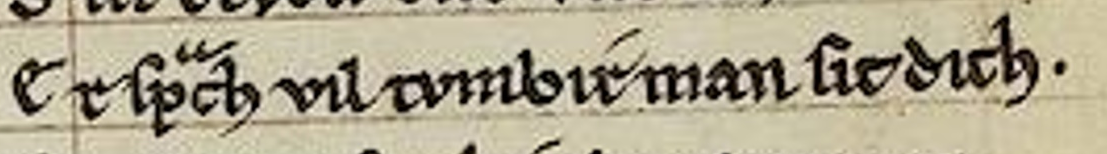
Er ſp(ra)ch vil tvmbir man ſit dich.
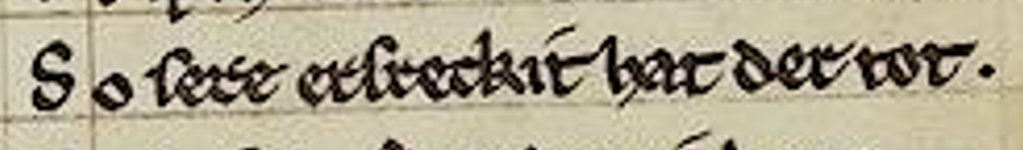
So ſere erſreckit hat der tot.
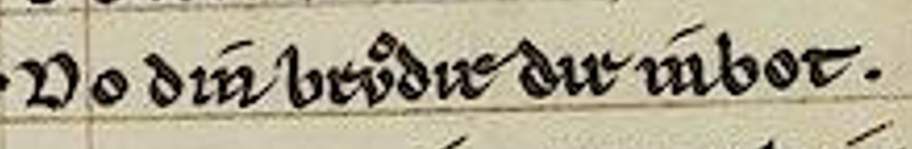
Do din brv°odir dir in bot.
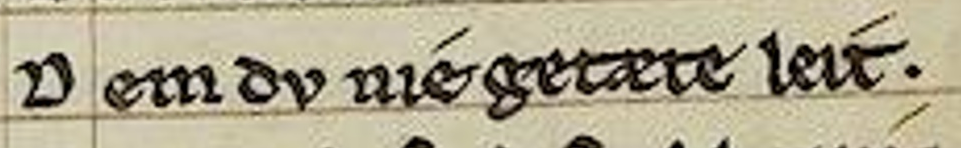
Dem dv nie get[ae]te leit.
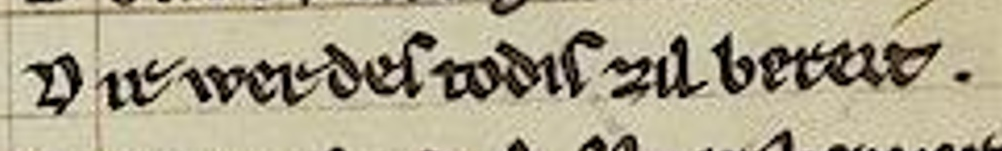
Dir werdeſ todiſ zil bereit.
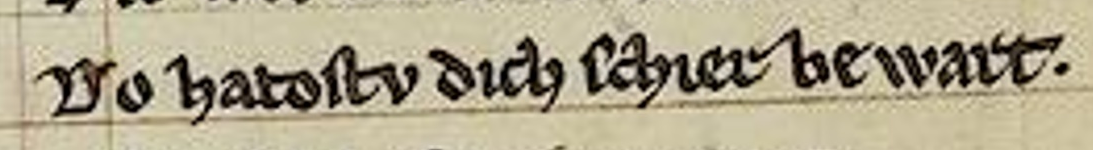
Do hatoſtv dich ſchier be wart.
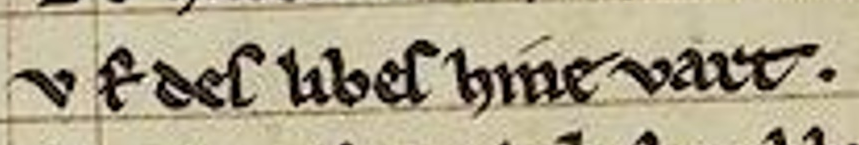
Vf deſ libeſ hine vart.
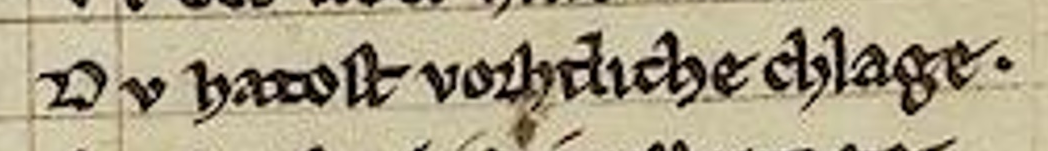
Dv hatoſt vorhtliche chlage.
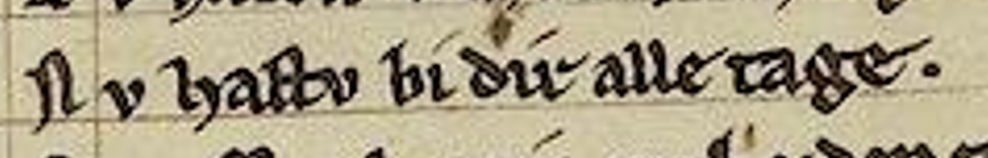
Nv haſtv bi dir alle tage.
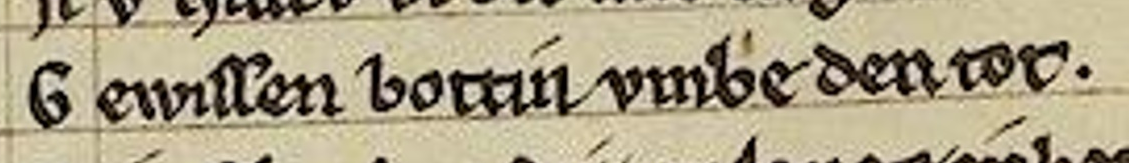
Gewiſſen bottin vmbe den tot.
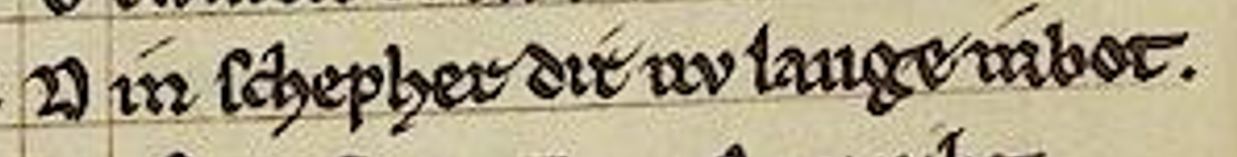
Din ſchepher dir nv lange inbot.
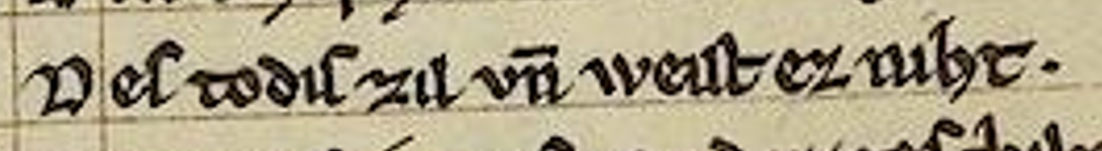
Deſ todiſ zil vn(d) weiſt ez niht.
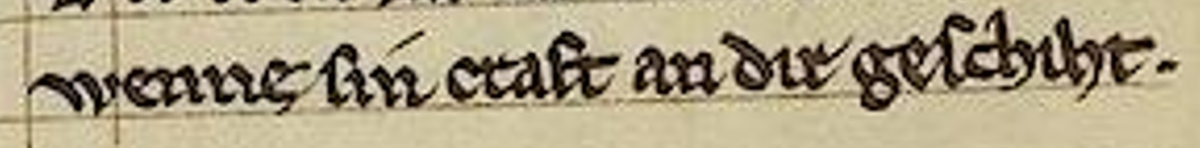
Wenne ſin craft an dir geſchiht.
